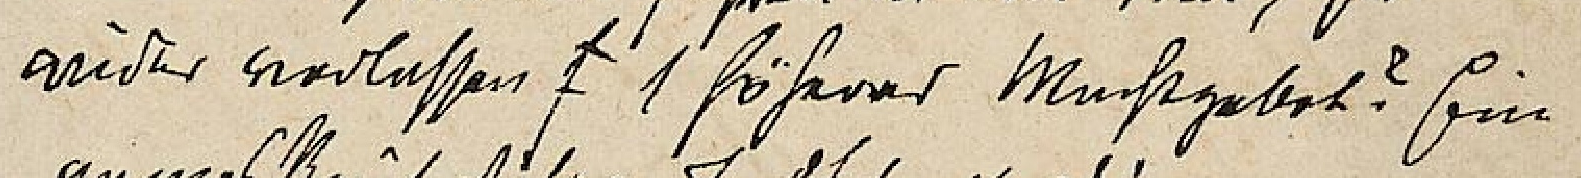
wieder verlassen f 1 höheres Machtgebet? Ein
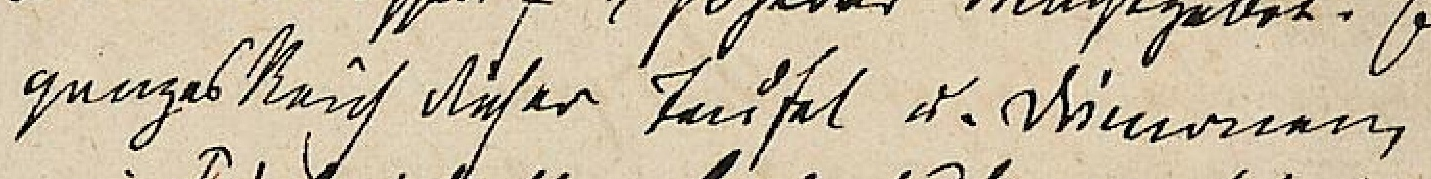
ganzes Reich dieser Teufel u. Dämonen,
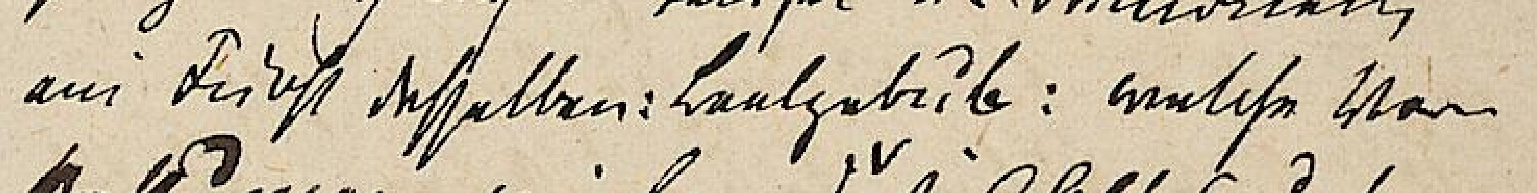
ein Fürst desselben: Beelzebub: welche Vor¬
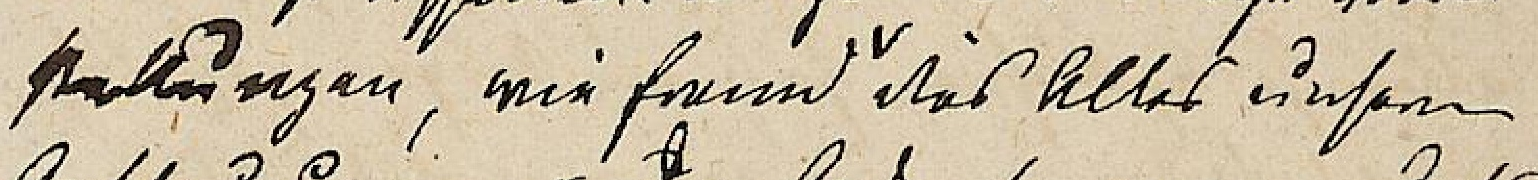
stellungen, wie fremd dies Alles unsern
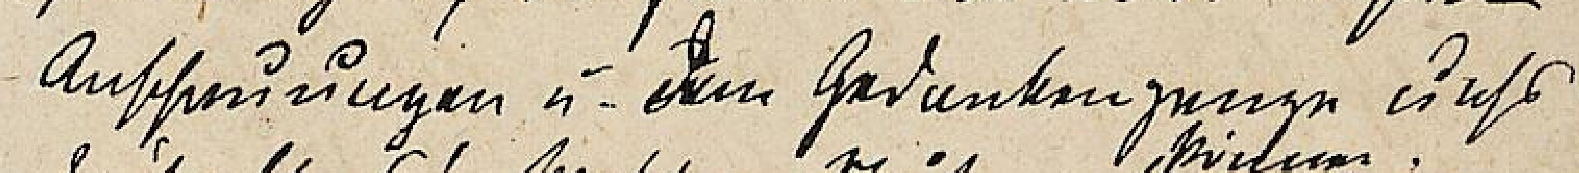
Anschauungen u. den Gedankengange unss
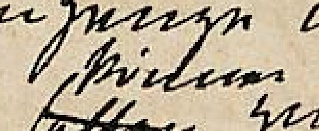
stünden
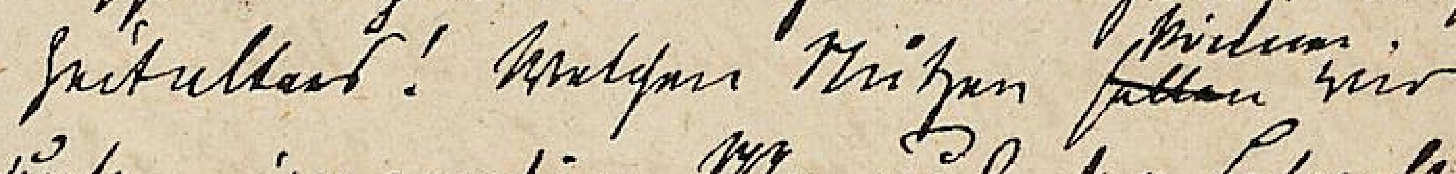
Zeitalters! Welchen Nutzen sollen wir
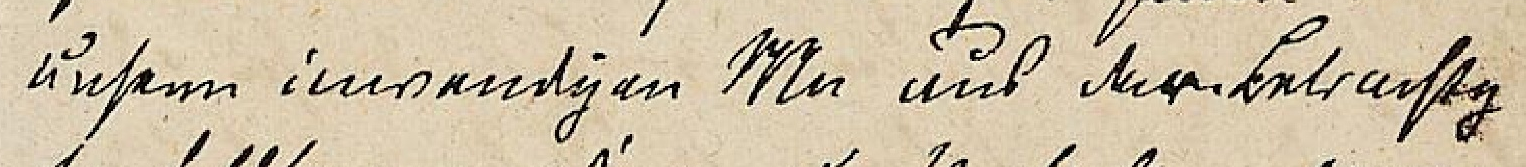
unserm inwendigen Mn aus der Betrachtg
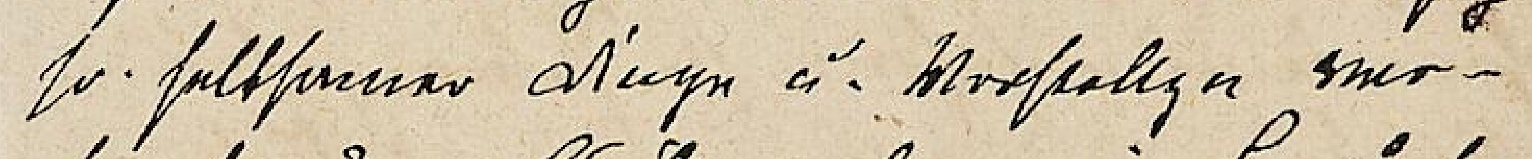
sr seltsamen Dinge un Vorstellgn ver¬
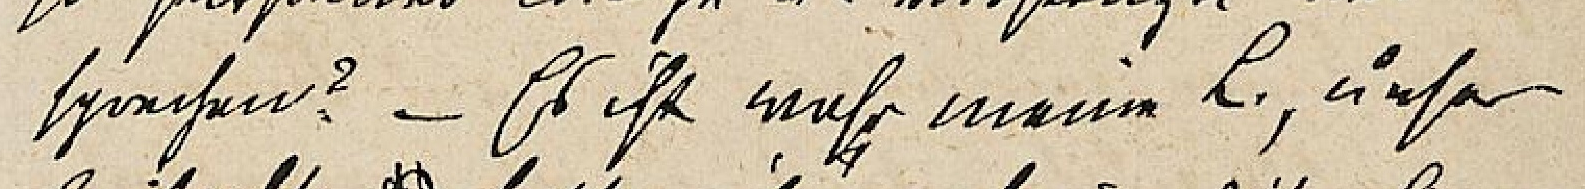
sprechen? _ Es ist wahr, meine L. unser
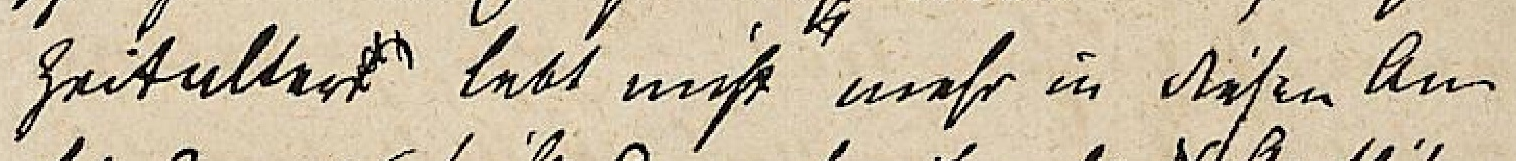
Zeitalter lebt nicht mehr in diesen An¬
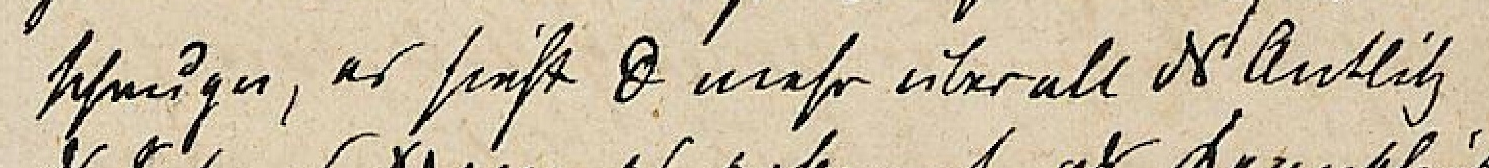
sschauungen, es sieht o mehr überall ds Antlitz
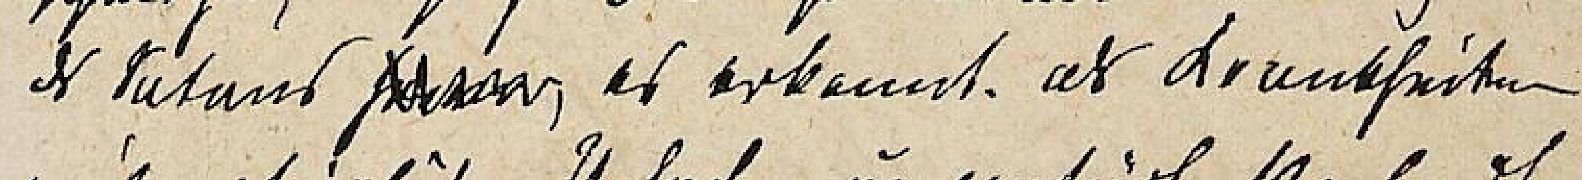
ds Satans freuen, es erkennt al Krankheiten
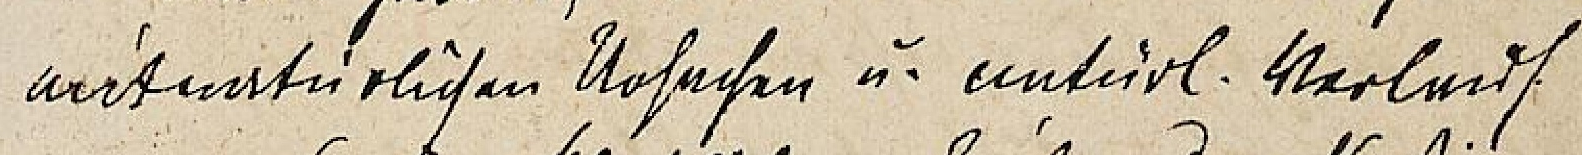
mit natürlichlichen Ursachen un natürl. Verlauf
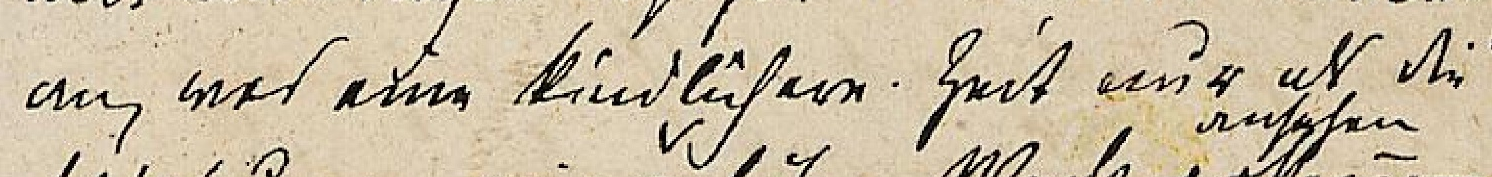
an, was eine kindlichere Zeit nur als die
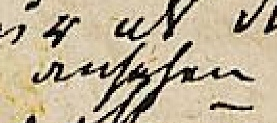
ansehen
